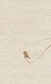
P.
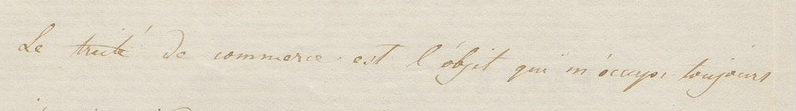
Le traité de commerce est l'objet qui m'occupe toujours
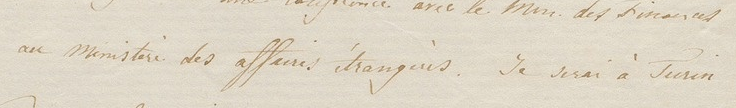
au Ministère des affaires étrangères. Je serai à Turin
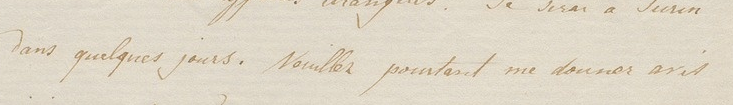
dans quelques jours. Veuillez pourtant me donner avis
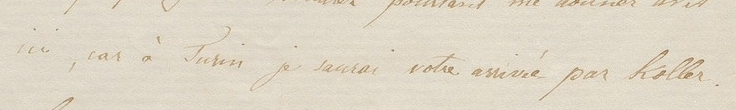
ici, car à Turin je saurai votre arrivée par Koller.
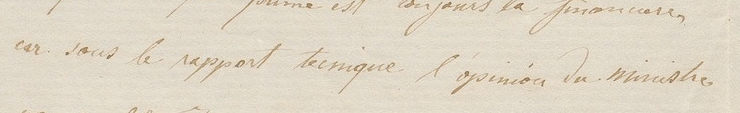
car sous le rapport tecnique l'opinion du Ministre
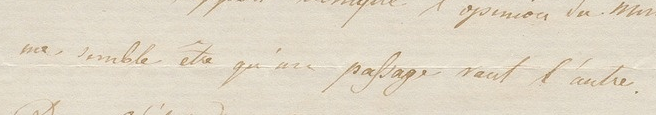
me semble être qu'un passage vaut l'autre.
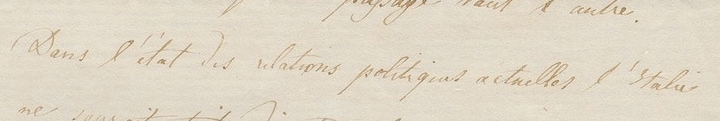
Dans l'éetat des relations politiques actuelles l'Italie
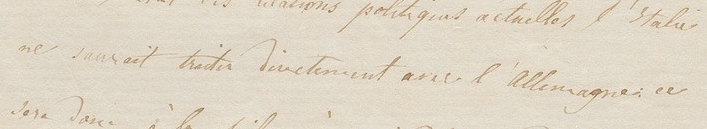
ne saurait traiter directement avec l'Allemagne: ce
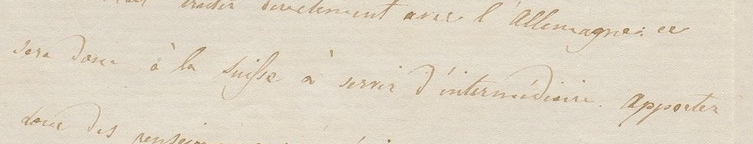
sera donc à la Suisse à servir d'intermédiaire. Apportez
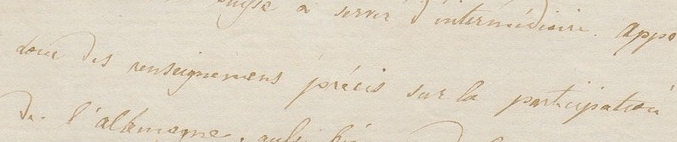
donc des renseignemens précis sur la participation
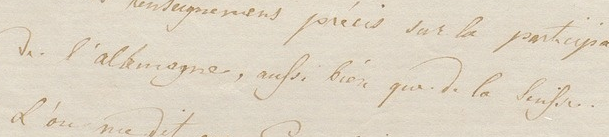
de l'Allemagne, aussi bien que de la Suisse.
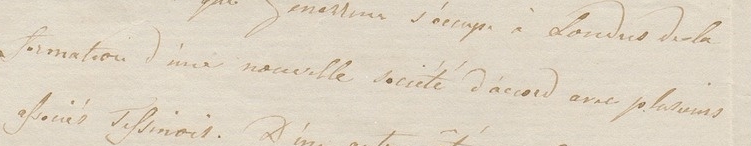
formation d'une nouvelle société d'accord avec plusieurs
